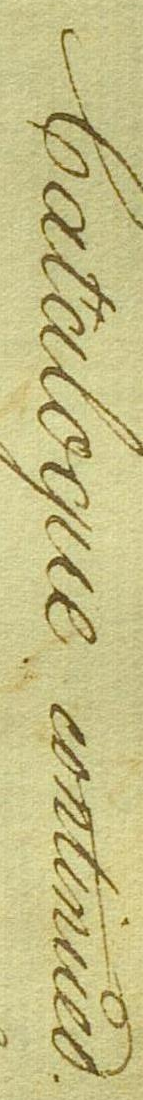Catalogue continued.
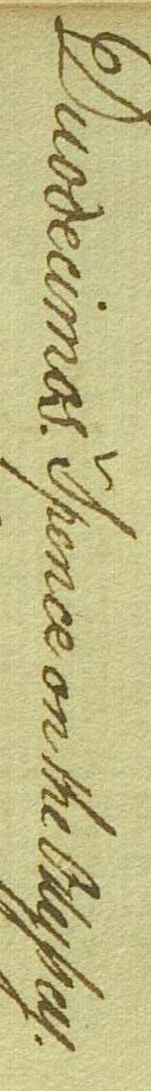Duodecimos. Spence on the Odyssey.
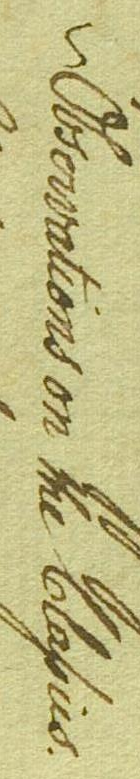- Observations on the Classics.
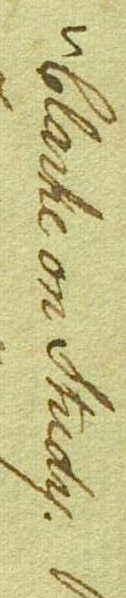- Clarke on Study.
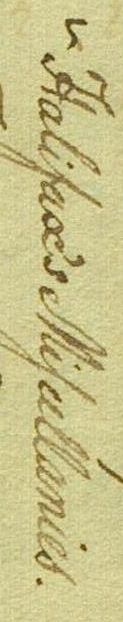- Halifax's Miscellanies.
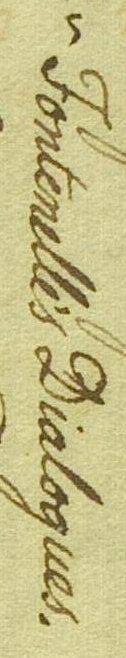- Fontenelle's Dialogues.
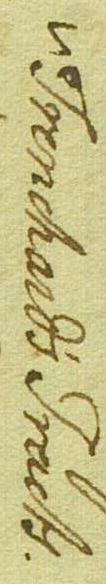- Trenchard's Tracts.
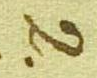2.
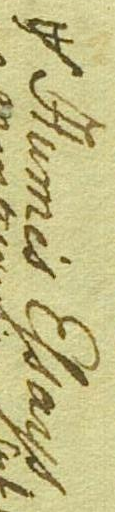- Hume's Essays
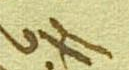4.
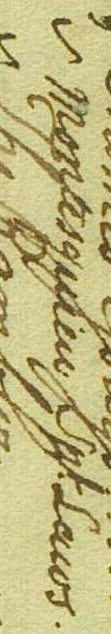- Montesquieu Sp^t. Laws
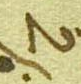2
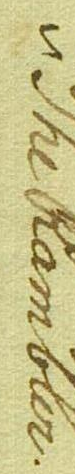- The Rambler
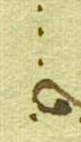6.
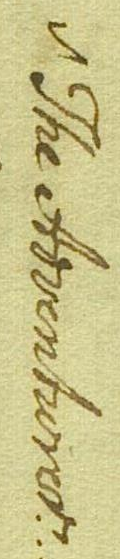- The Adventurer
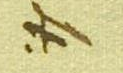4.
